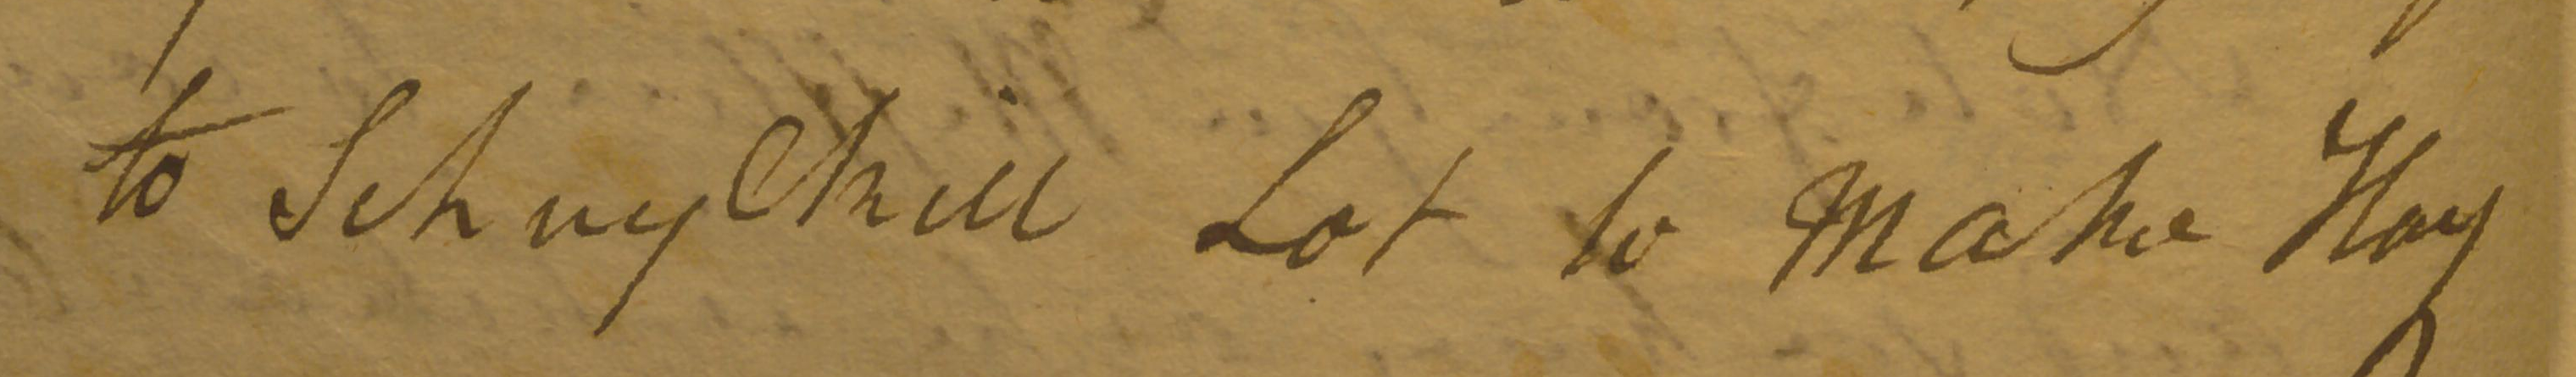to Schuylkill Lot to Make Hay
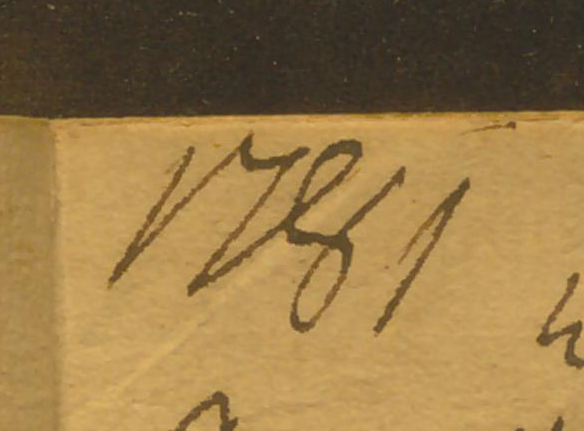1781
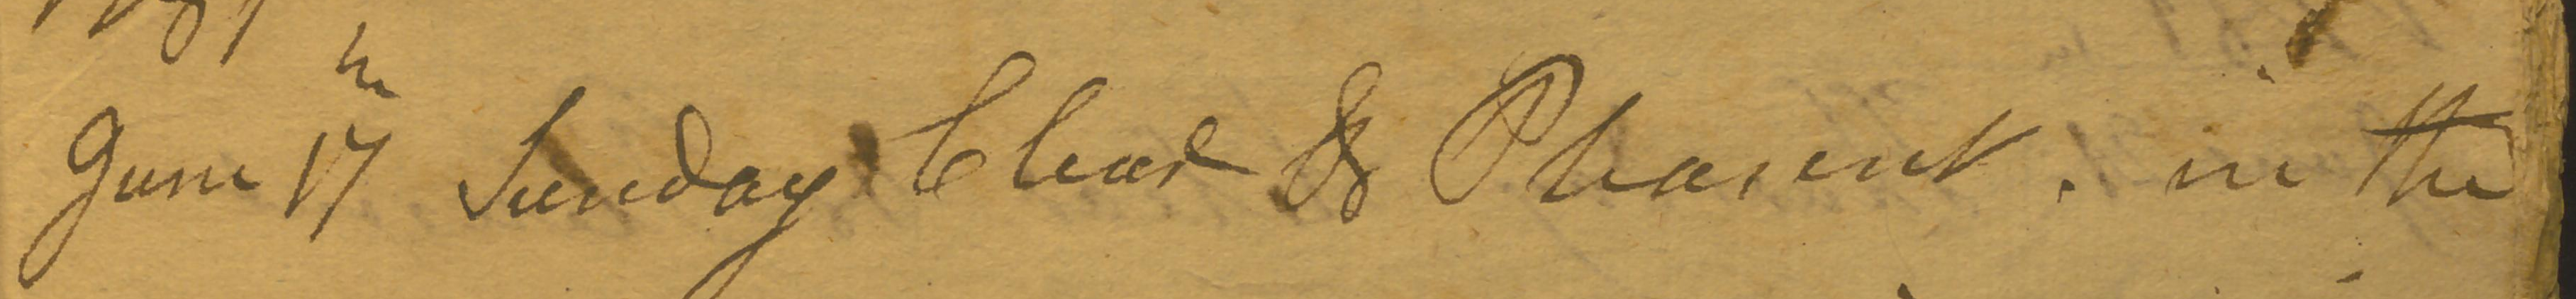June 17^th Sunday Clear & Pleasent. in the
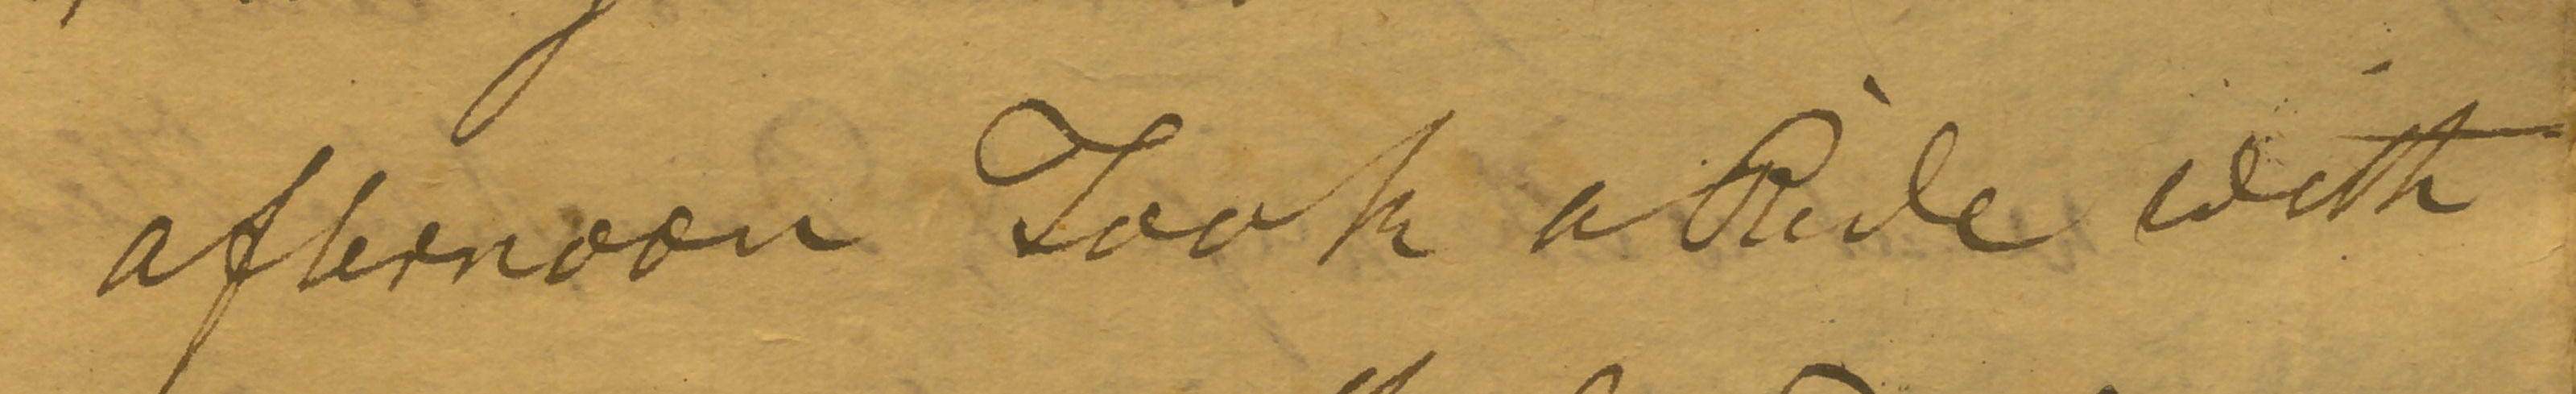afternoon Took a Ride with
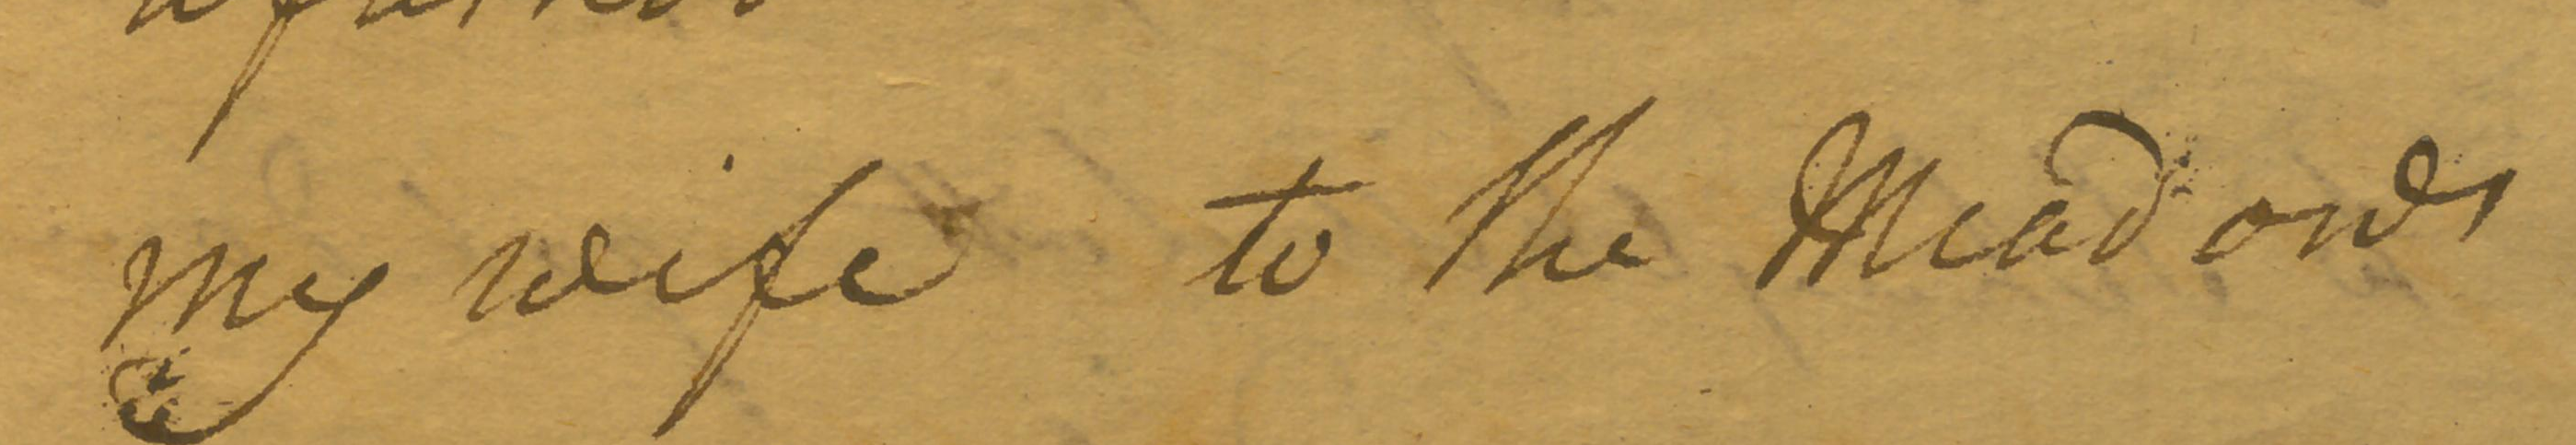my wife, to the Meadows
